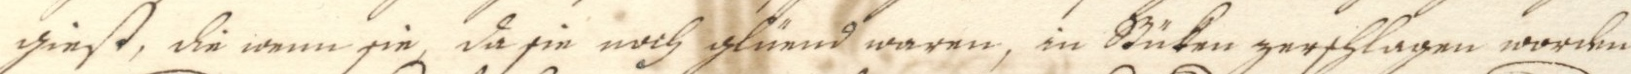giest, die wenn sie, da sie noch glüend waren, in Stüken zerschlagen worden
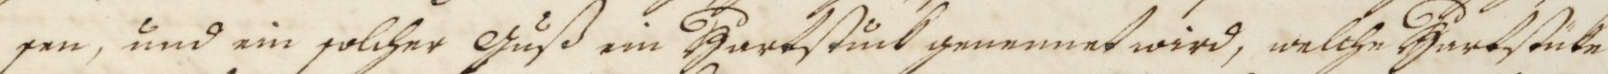sen, und ein solcher Guß ein Hartstuck genennet wird, welche Hartstüke
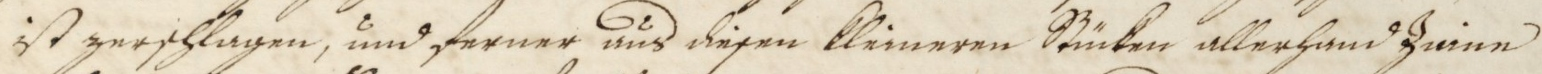ist zerschlagen, und ferner aus diesen kleineren Stücken allerhand Zninn
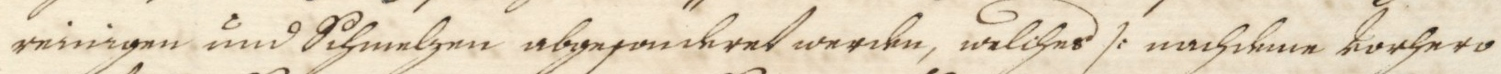reinigen und Schmelzen abgesonderet werden, welches (nachdeme vorhero
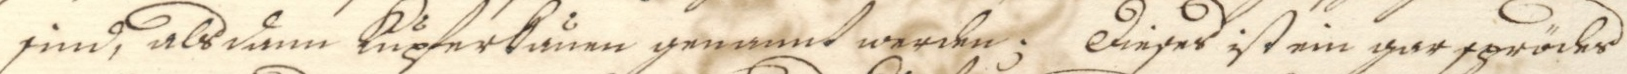sind, als dann Kupferkauen genannt werden. Dieses ist ein gar sprödes
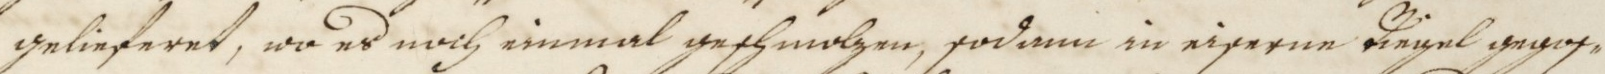gelieferet, wo es noch einmal geschmolzen, sodann in eiserne Tiegel gegos-
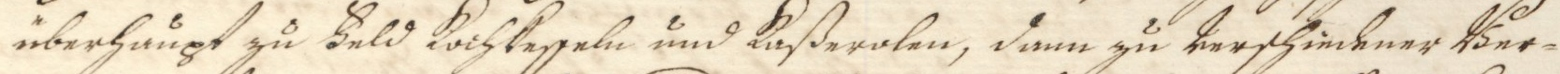überhaupt zu Feld Kochkesseln und Kaßerolen, dann zu verschiedener Ver-
